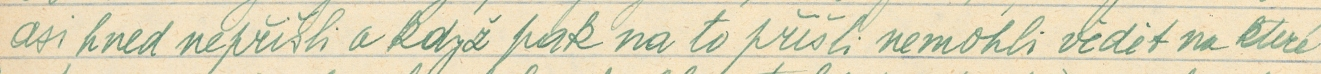asi hned nepřišli a když pak na to přišli nemohli vědět na které
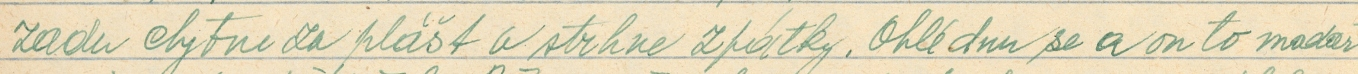zadu chytne za plášt a strhne zpátky. Ohlédnu se a on to madař
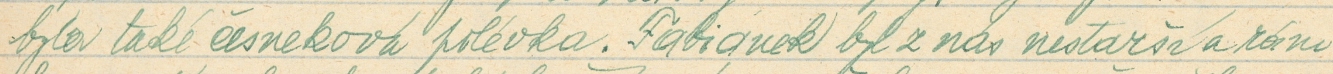byla také česneková polévka. Fabiánek byl z nás nestarší a ráno
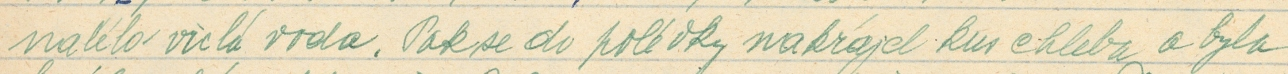naléla vřelá voda. Pak se do polévky nakrájel kus chleba a byla
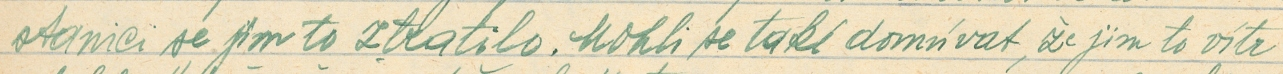stanici se jím to ztratilo. Mohli se také domnívat, že jim to vítr
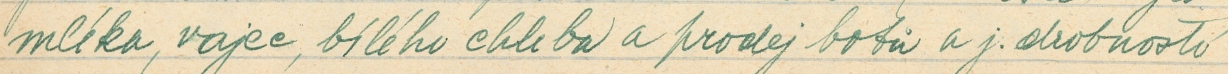mléka, vajec, bílého chleba a prodej botů a j. drobností
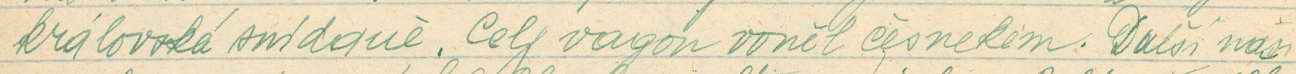královská snídaně. Celý vagon voněl česnekem. Další naší
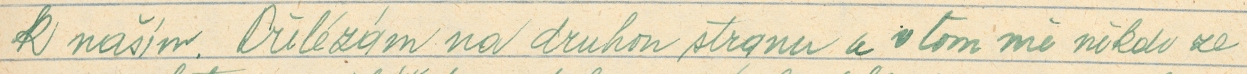k naším. Přelézám na druhou stranu a v tom mě někdo ze
